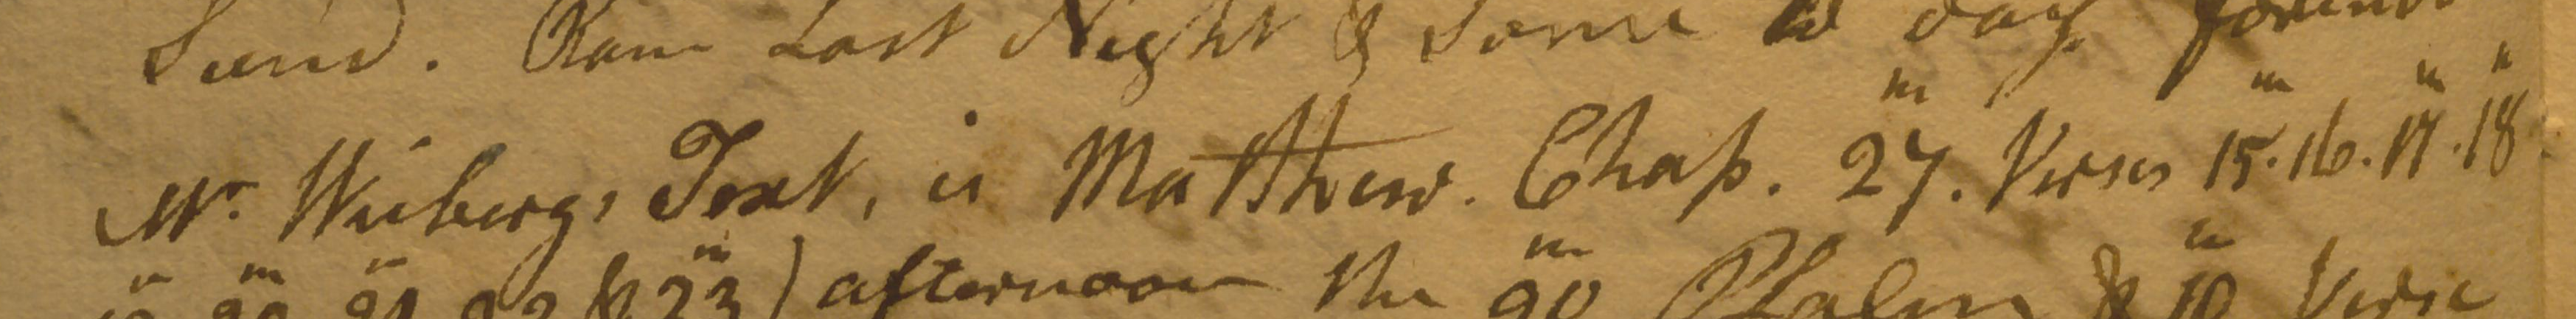M^r. Weibergs Text, is Matthew. Chap. 27th. Verses 15^t. 16. 17^th. 18^th
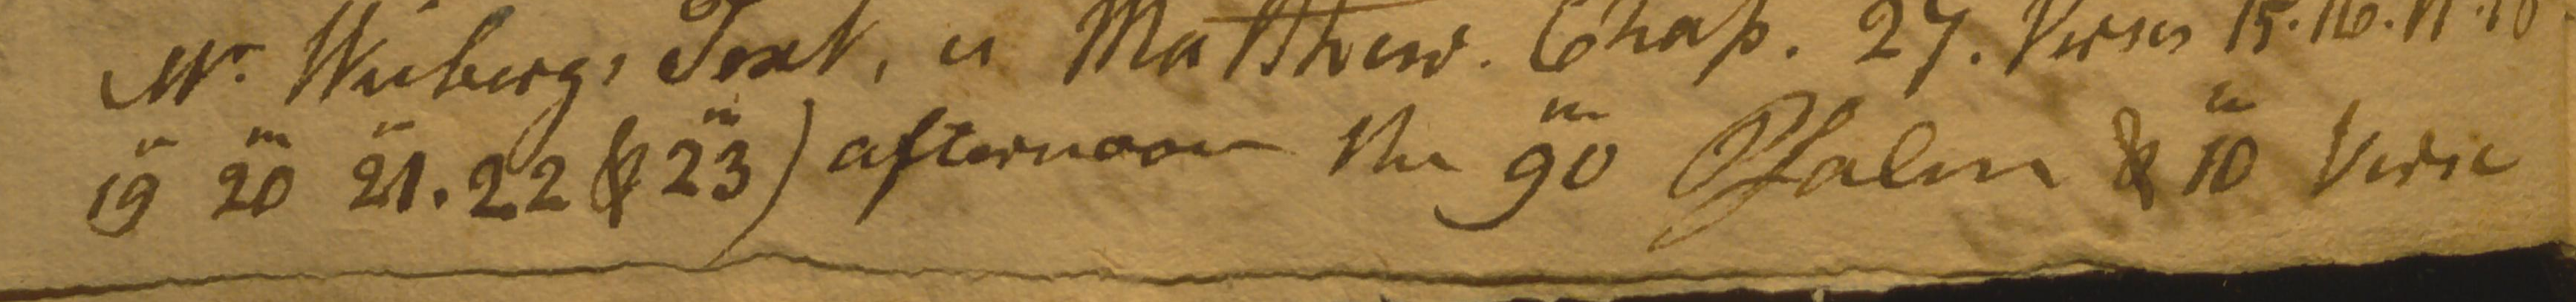19^th 20^th 21^th. 22 & 23^th) afernoo the 90^th Psalm 10^th Verse
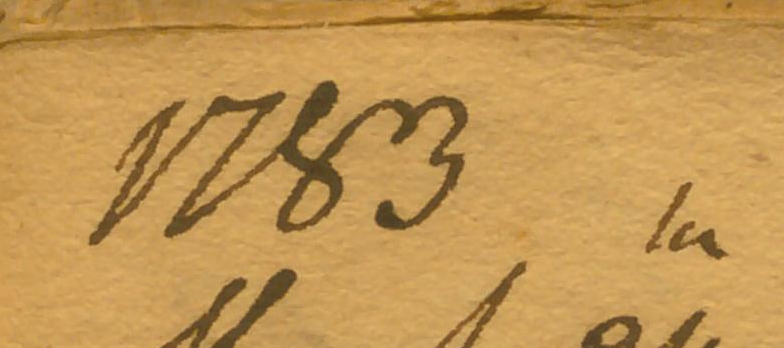1783
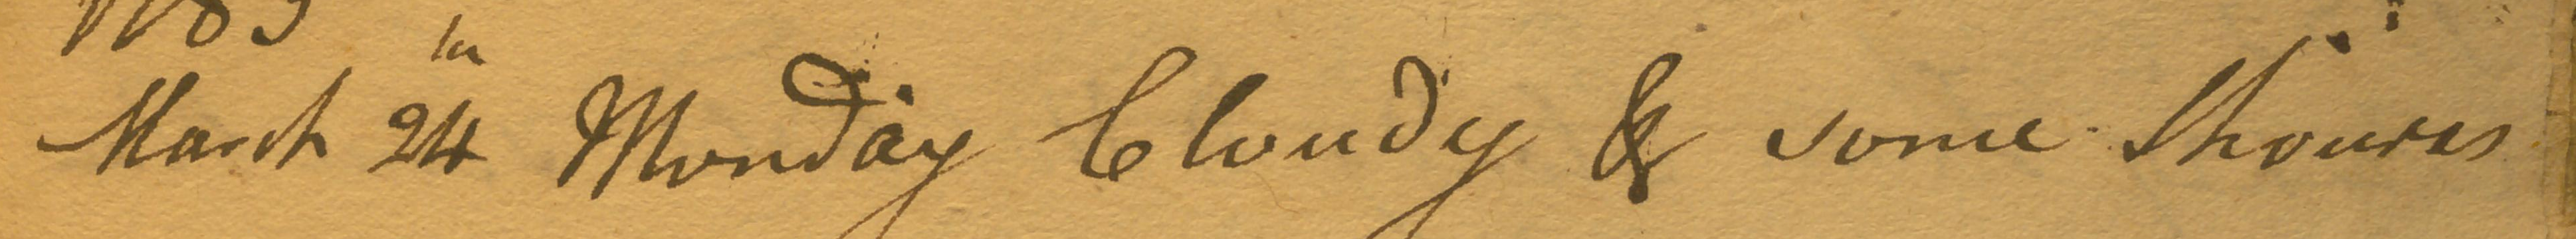March 24^th Monday Cloudy & some Shoures
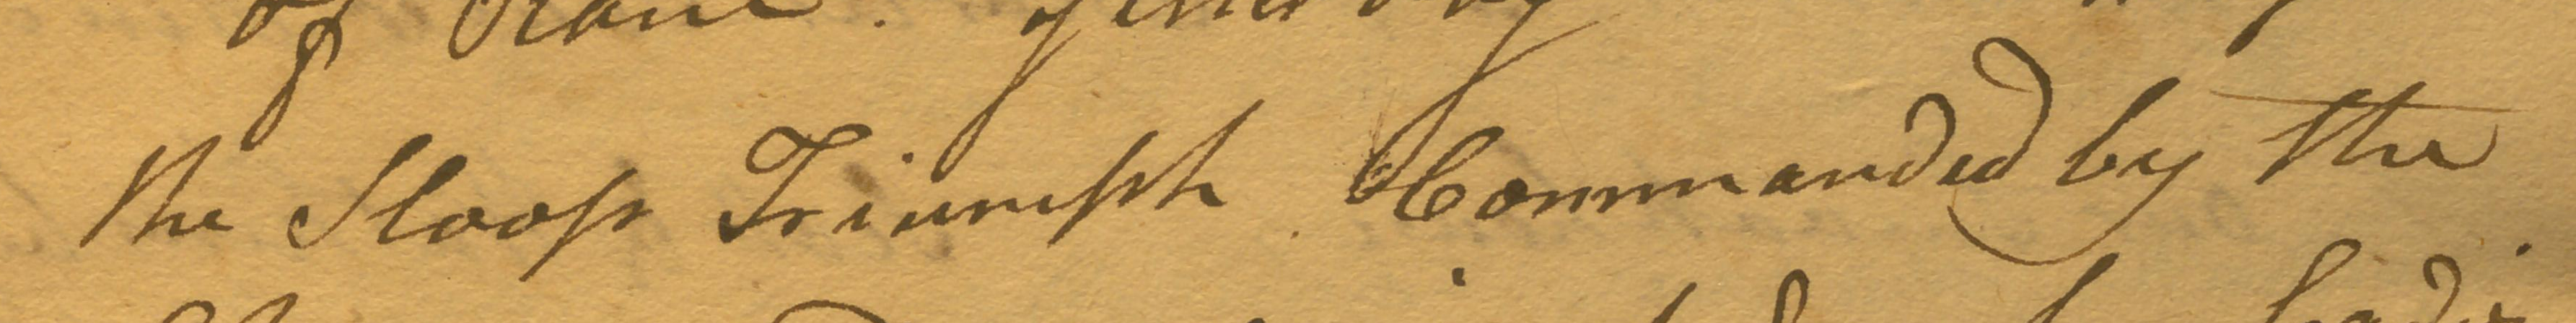the Sloops Triumph Commanded by the
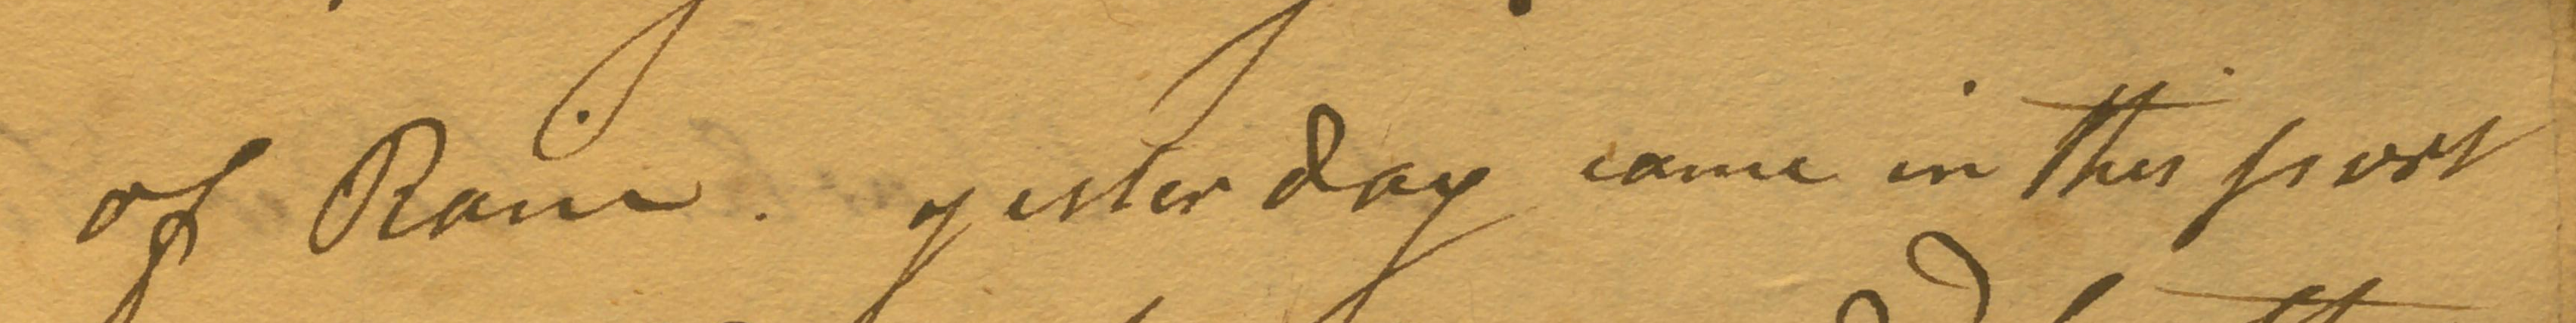of Rain. yesterday came in this port
